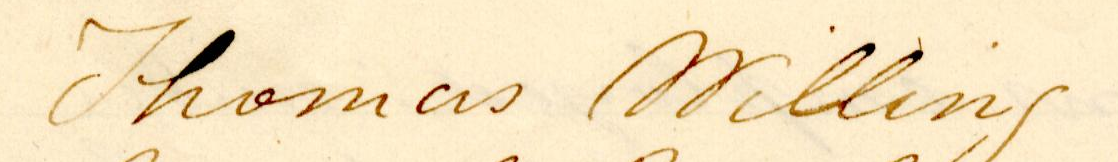Thomas Willing
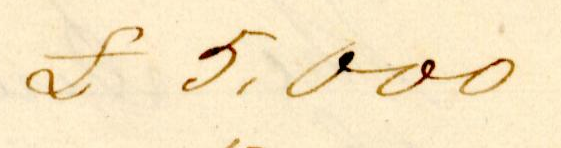£5,000
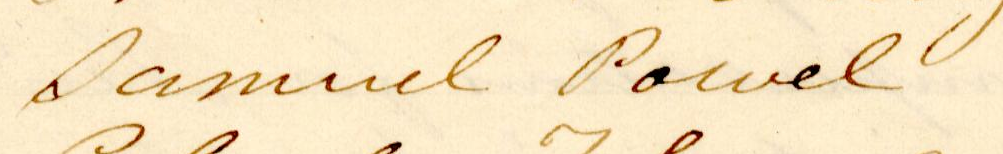Samuel Powel
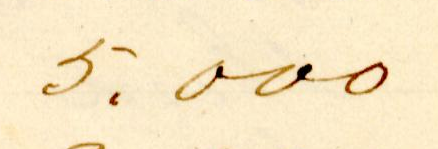5,000
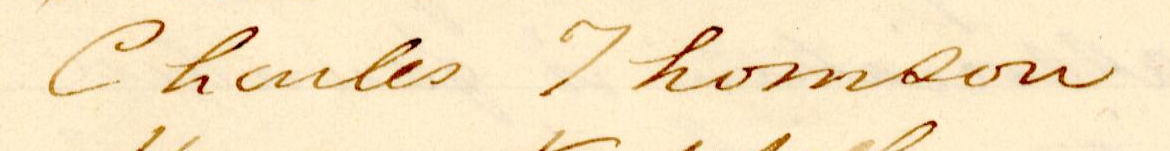Charles Thomson
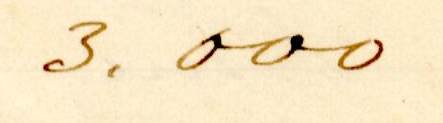3,000
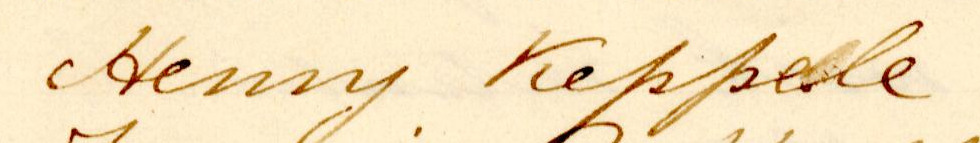Henry Keppele
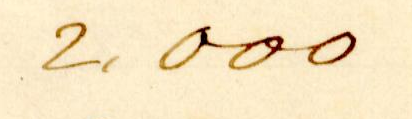2,000
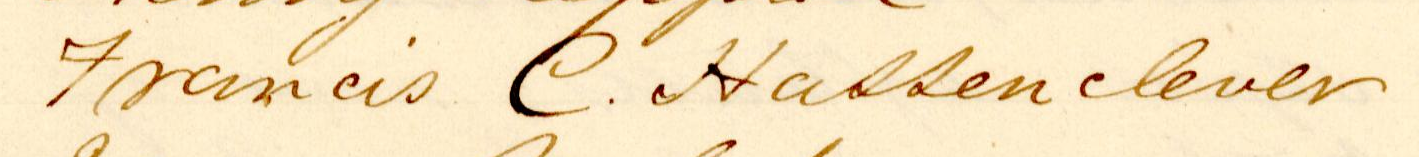Francis C. Hallenclever
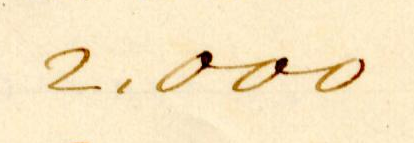2,000
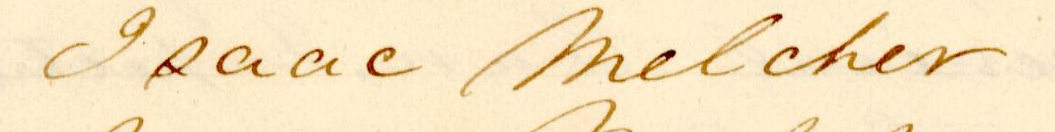Isaac Melcher
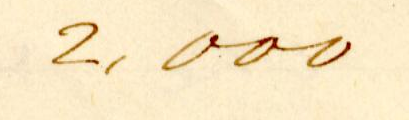2,O00
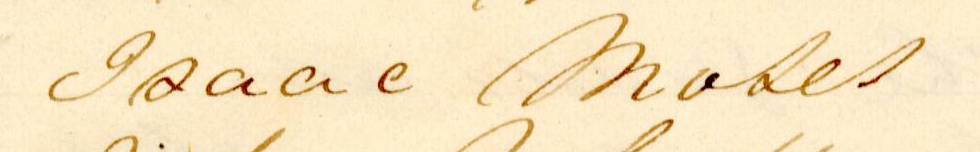Isaac Moses
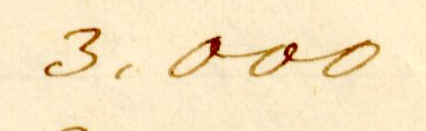3,000
